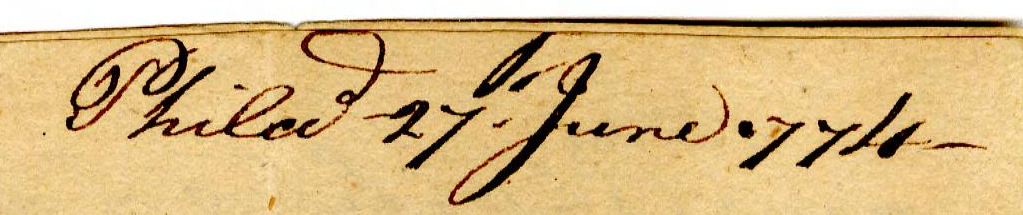Phila^d 27.^th June 1774
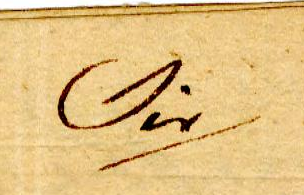Sir
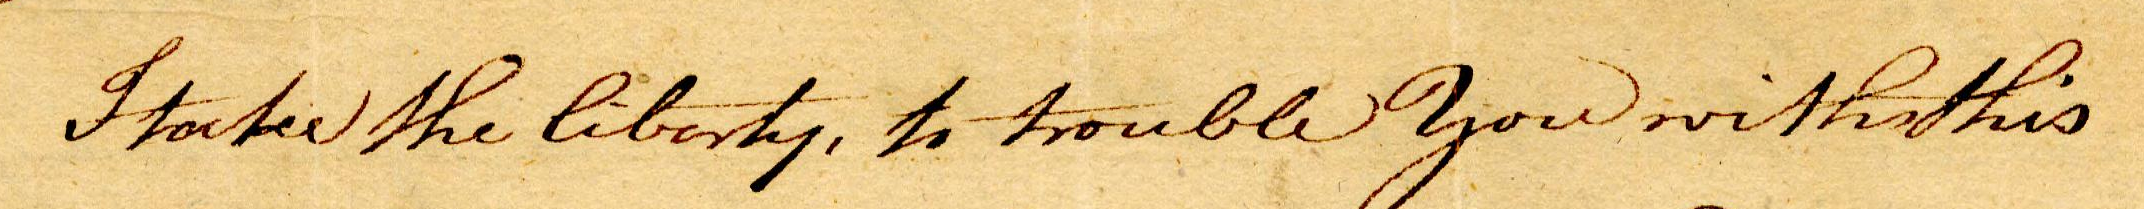I take the liberty, to trouble You with this
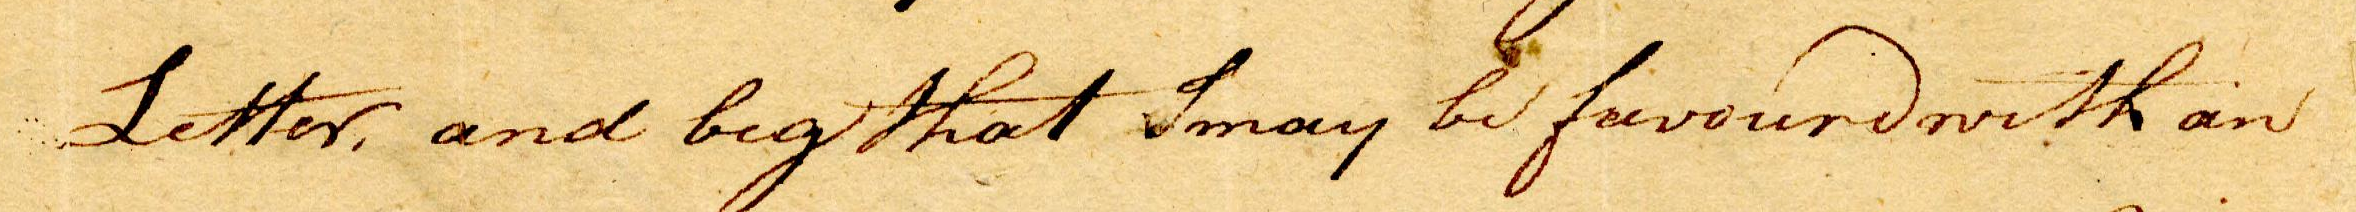Letter, and beg that I may be favourd with an
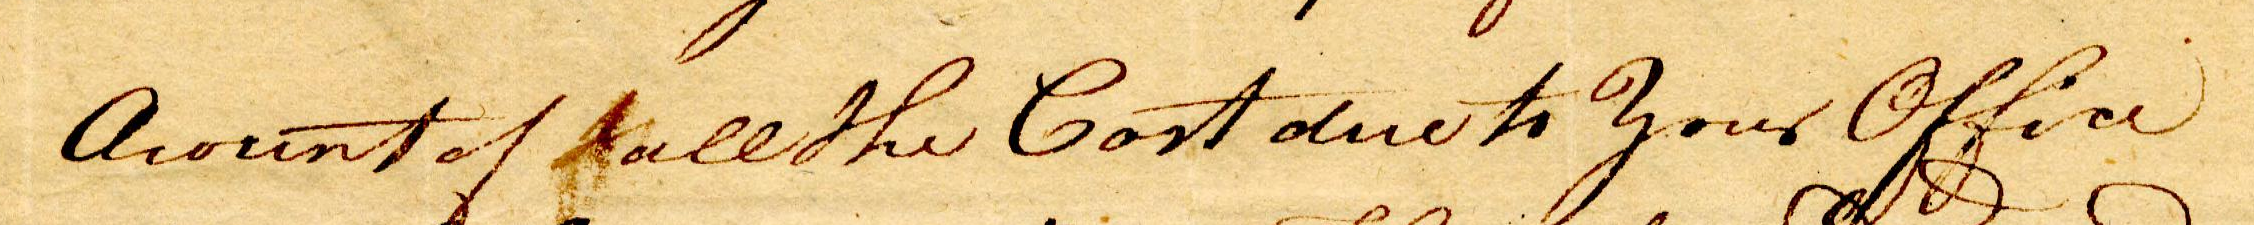Acount of all the Cost due to Your Office
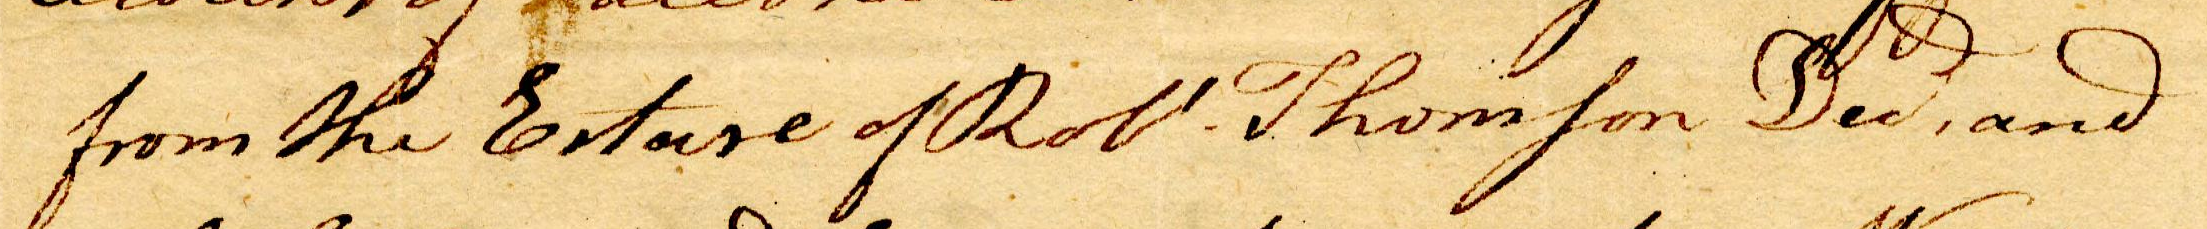from the Estate of Rob^t. Thomson Dec^d, and
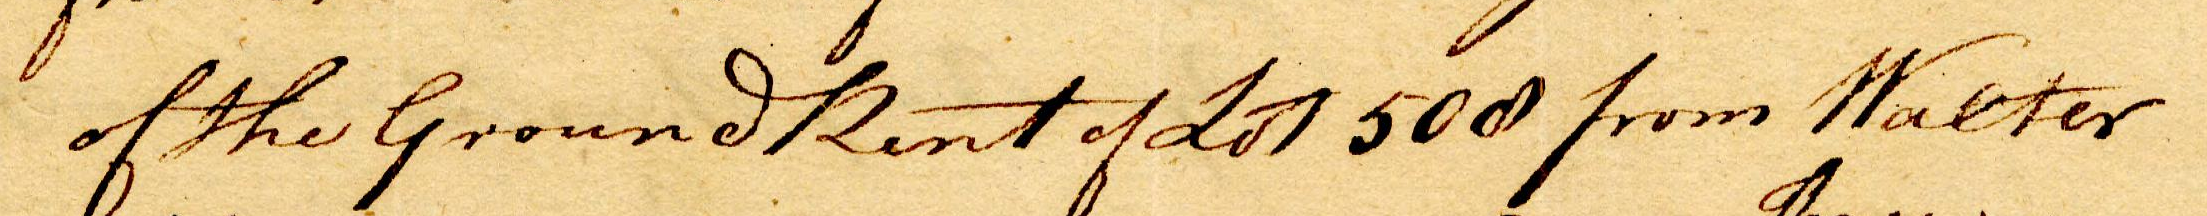of the Ground Rent of Lot 500 from Walter
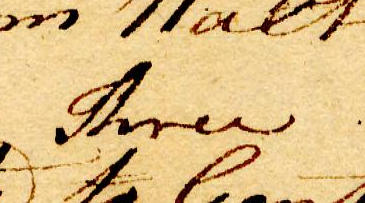three
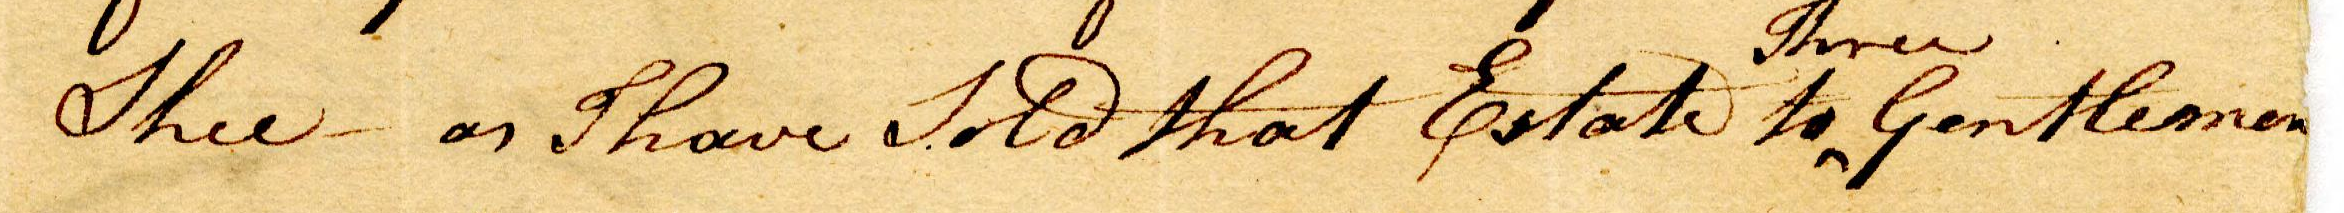Shee- as I have sold that Estate to ^ Gentlemen
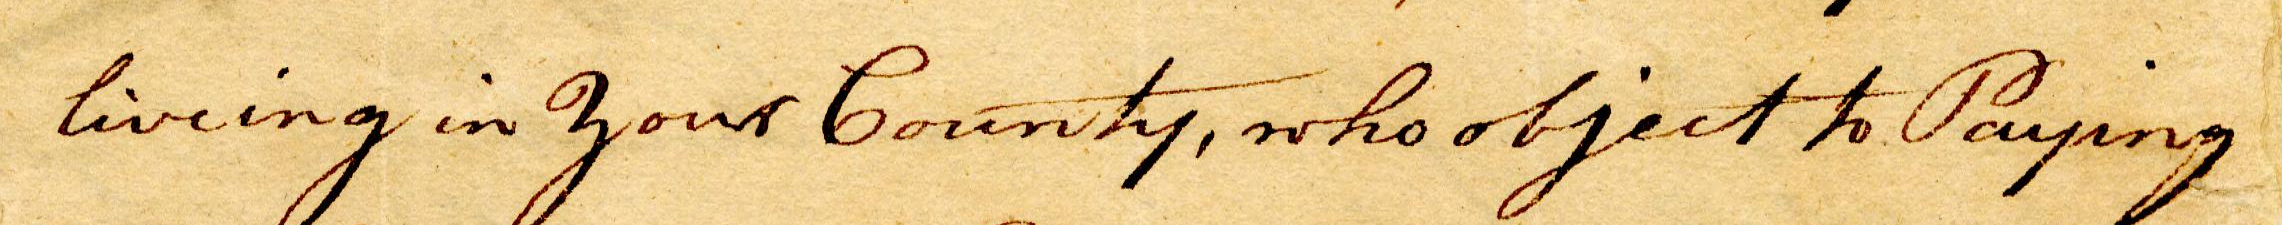liveing in your County, who object to Paying
